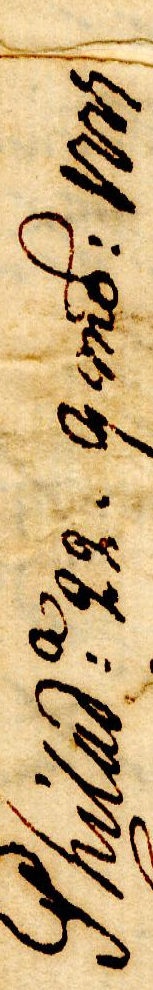Philad:^a 22. 9 mo: 1777
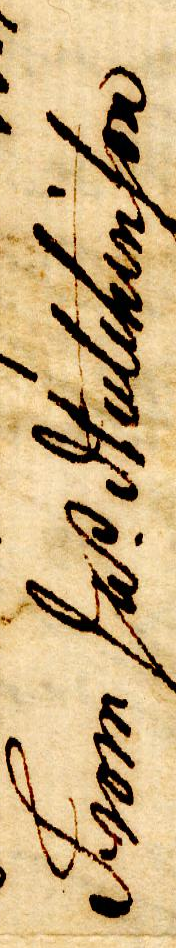From Ja^s. Hutchinson
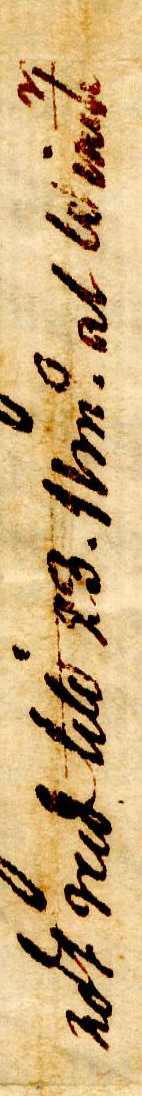not recd. till 23. 11m^o. at Winch^r
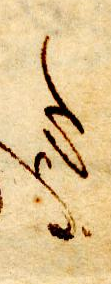For
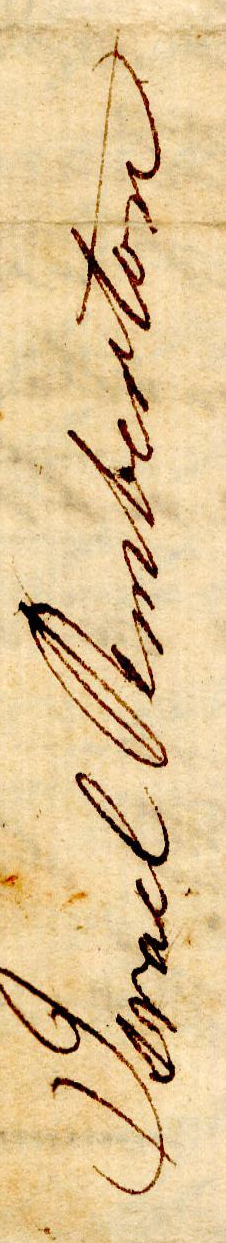Israel Pemberton
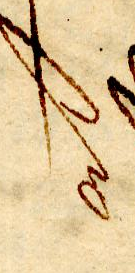at
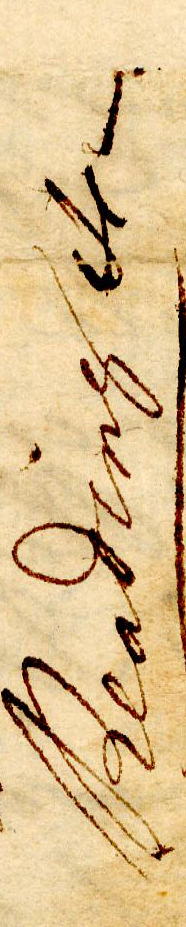Reading &c.
